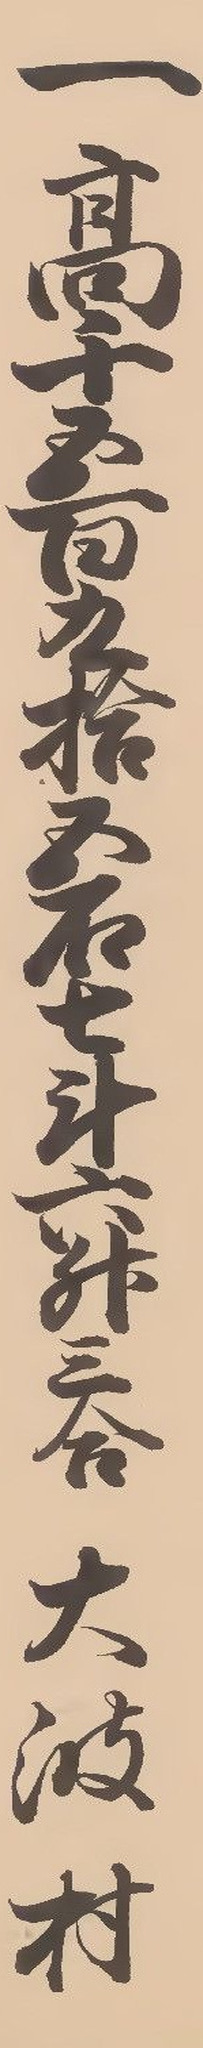一高千五百九拾五石七斗六升三合大波村
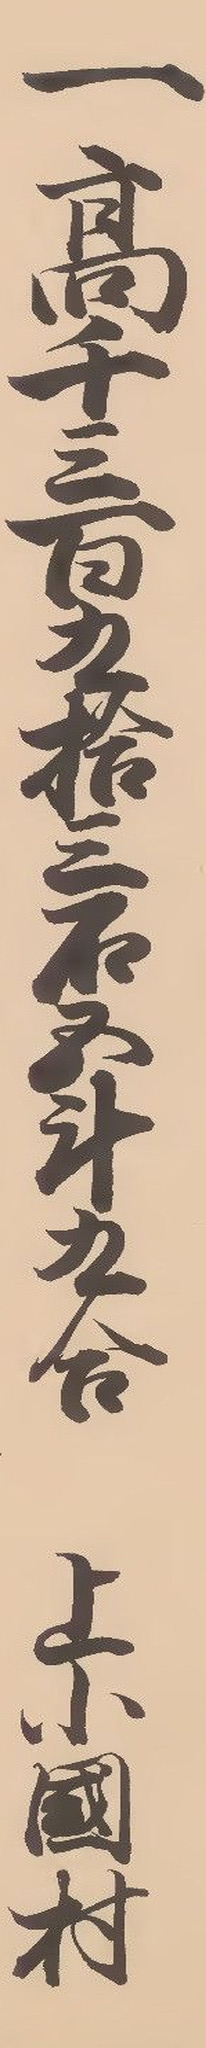一高千三百九拾三石五斗九合上小国村
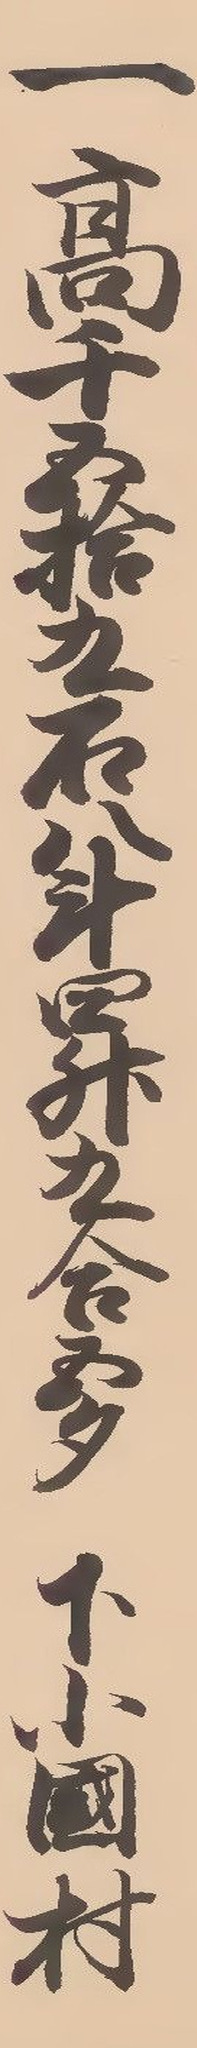一高千五拾九石八斗四升九合五勺下小国村
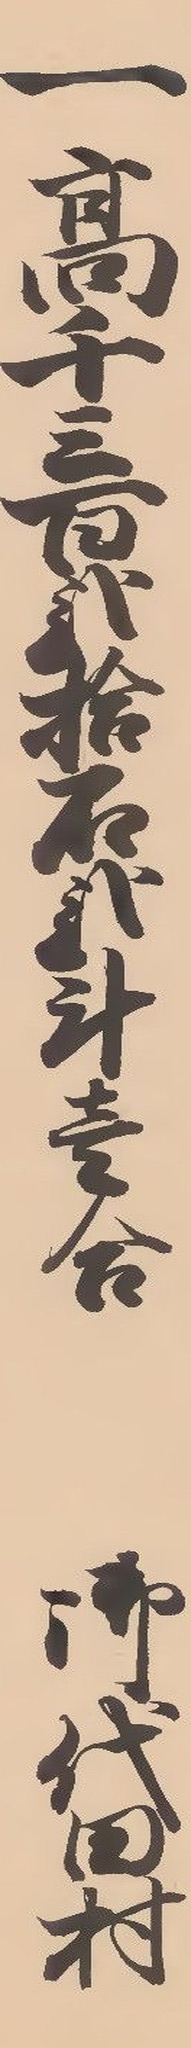一高千三百弐拾石弐斗壱合御代田村
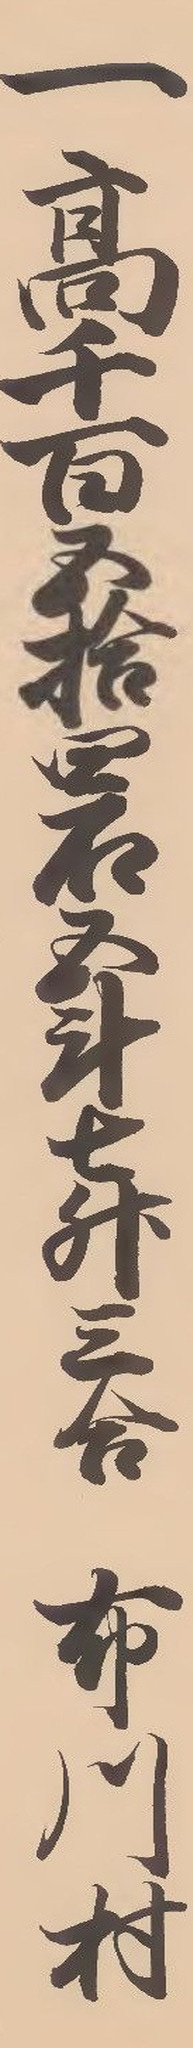一高千百五拾四石五斗七升三合布川村
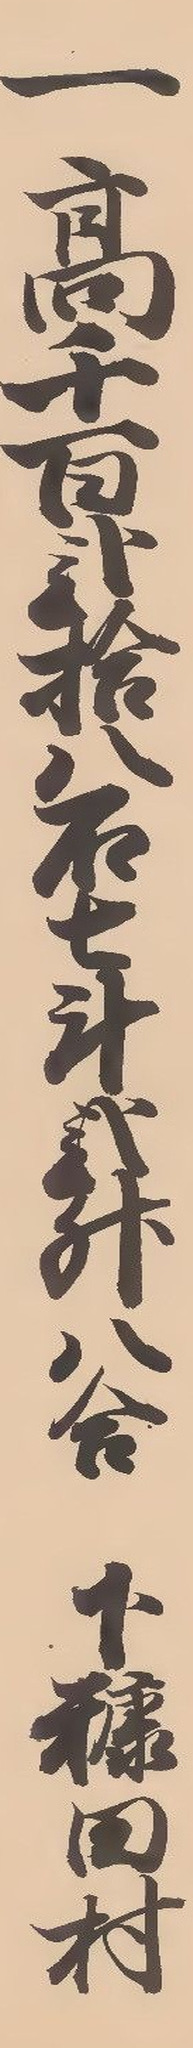一高千百弐拾八石七斗弐升八合下糠田村
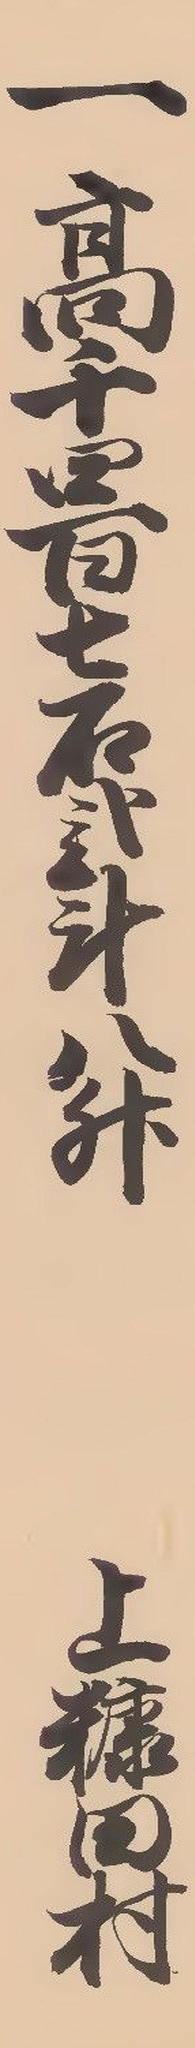一高千四百七石弐斗八升上糠田村

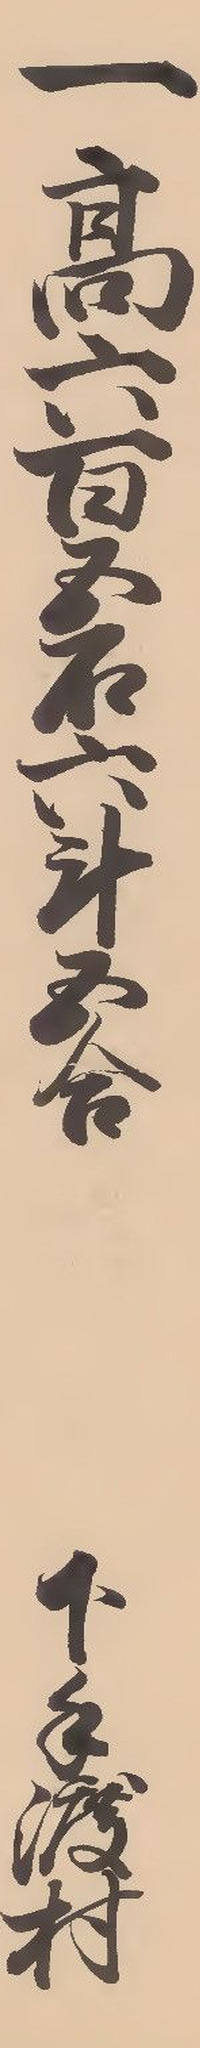一高六百五石六斗五合下手渡村
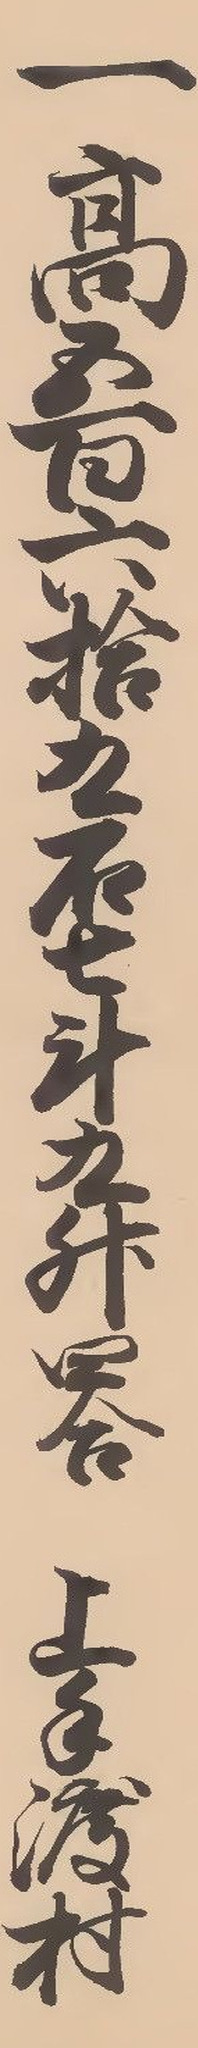一高五百六拾九石七斗九升四合上手渡村
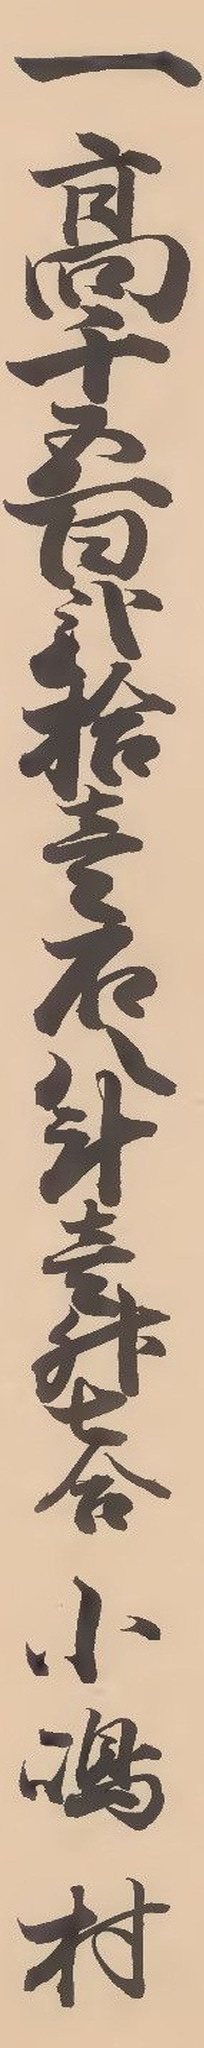一高千五百弐拾壱石八斗壱升七合小島村
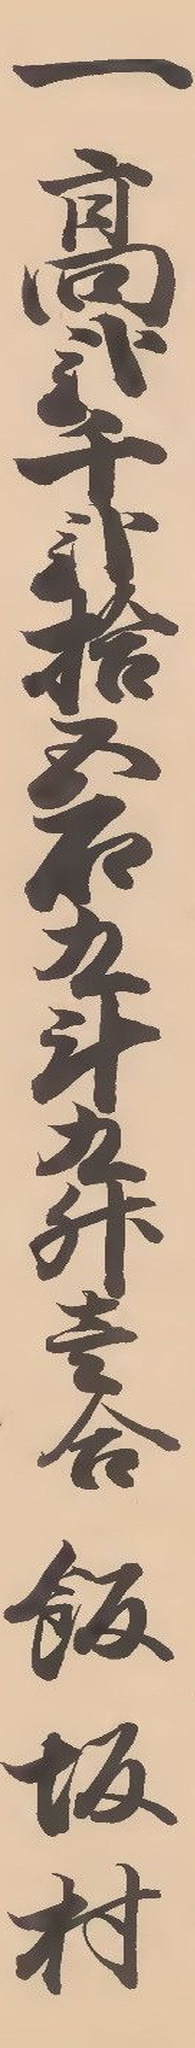一高弐千弐拾五石九斗九升壱合飯坂村
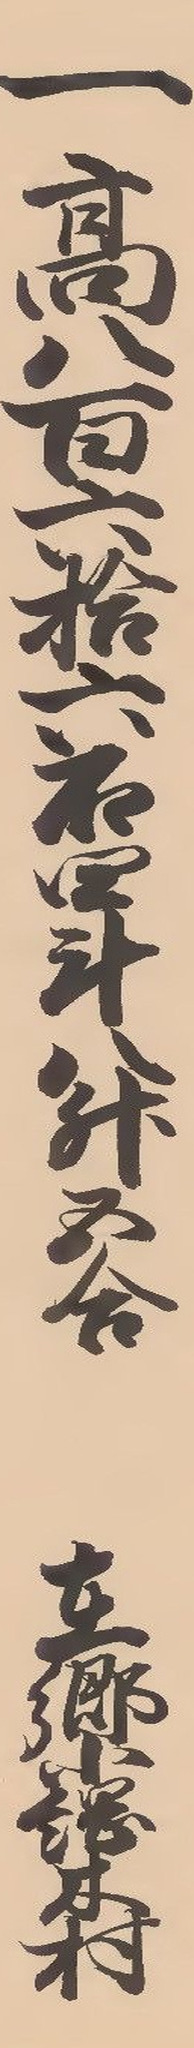一高八百六拾六石四斗八升五合在郷小綱木村
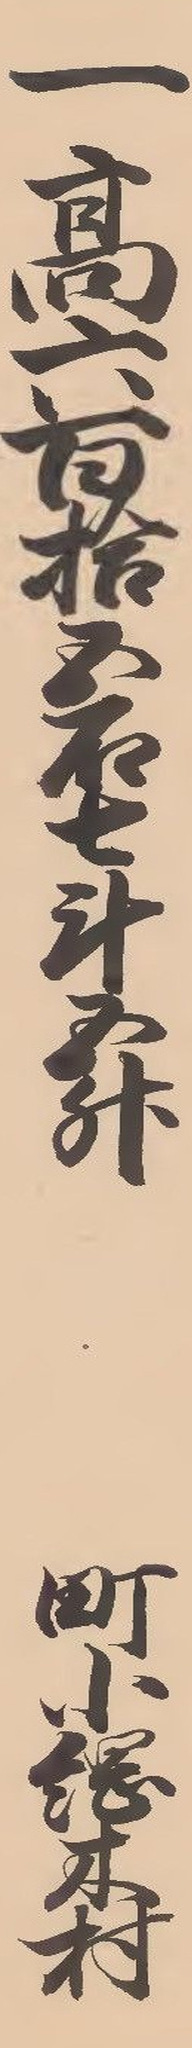一高六百拾五石七斗五升町小綱木村
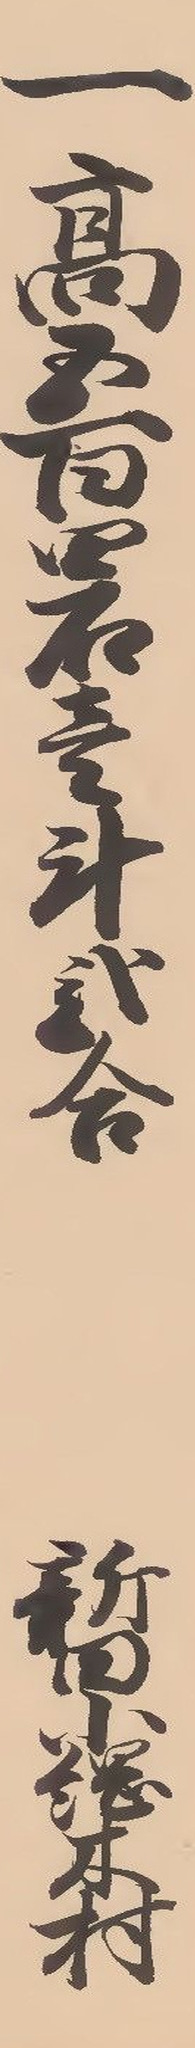一高五百四石壱斗弐合新田小綱木村
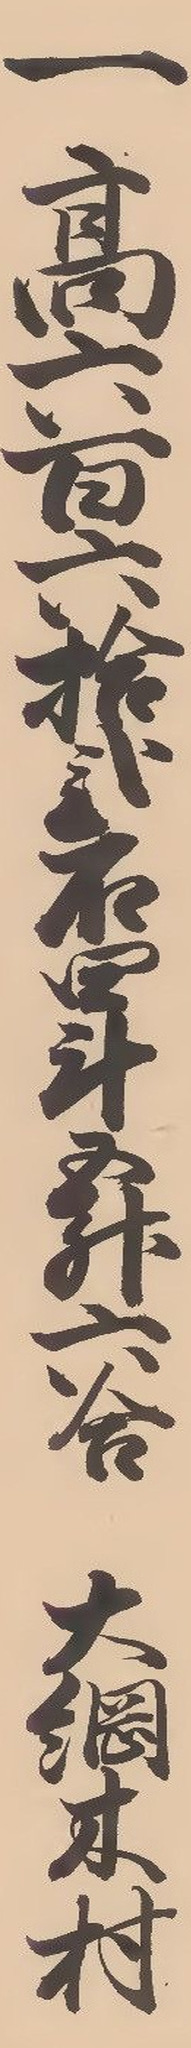一高六百六拾弐石四斗五升六合大綱木村

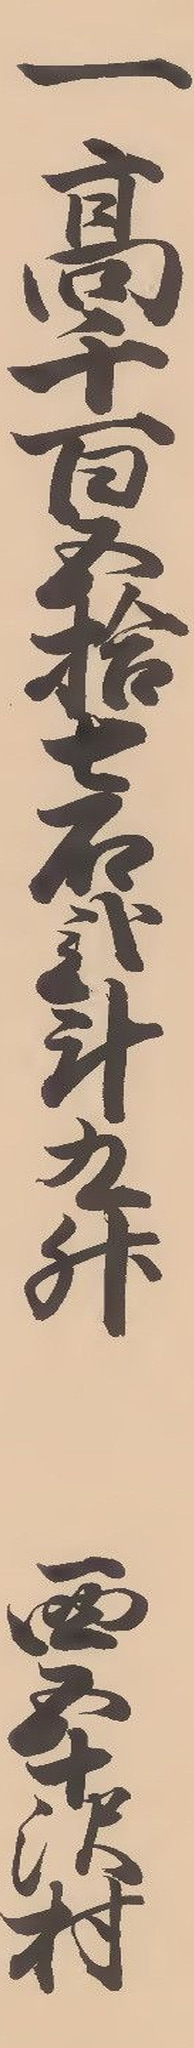一高千百五拾七石弐斗九升西五十沢村
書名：陸奥国郷帳　４
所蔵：国立公文書館 National Archives of Japan
